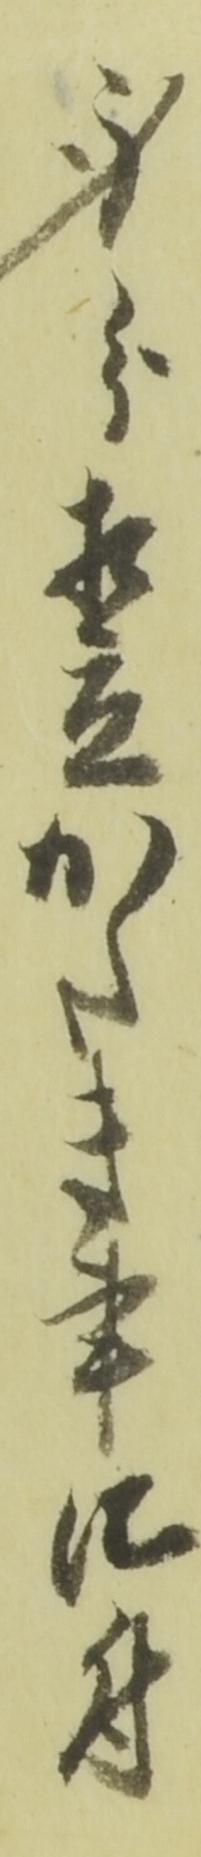身分相立かたき事に付
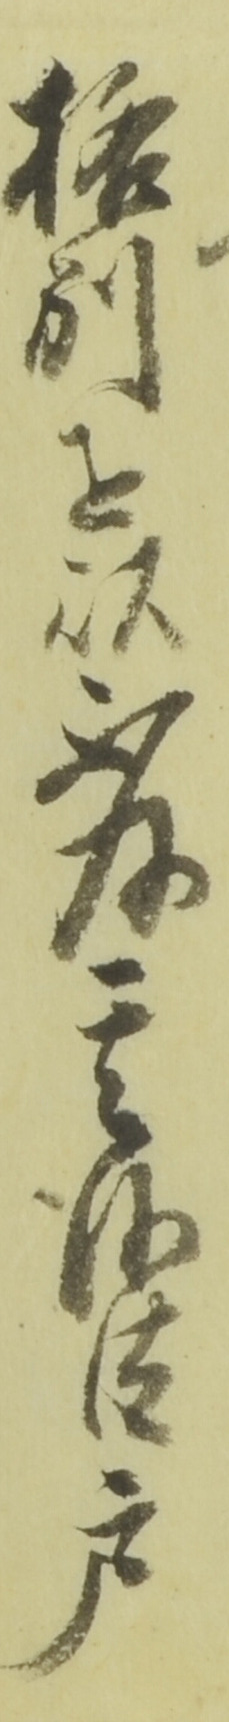格別を以不及其沙汰戸
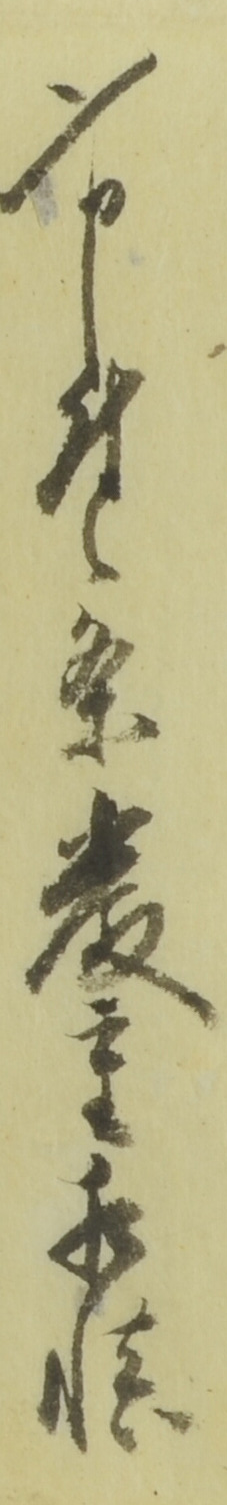〆申付候条厳重相慎
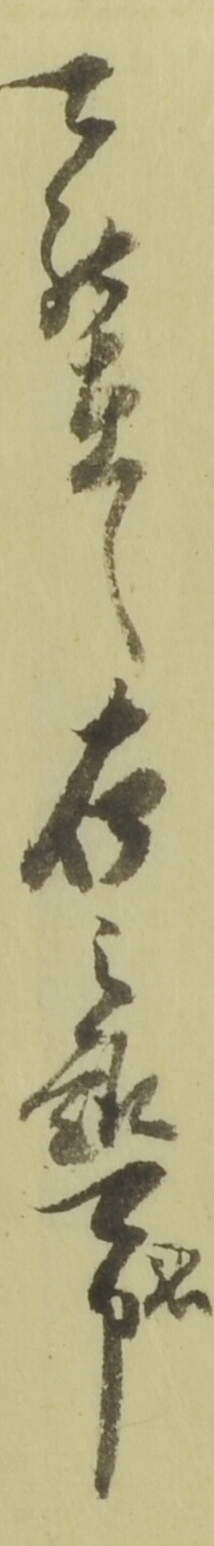可罷在候右之趣可被申
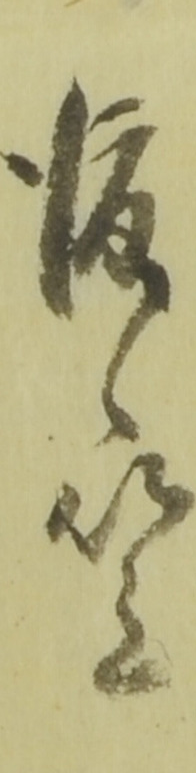渡候以上
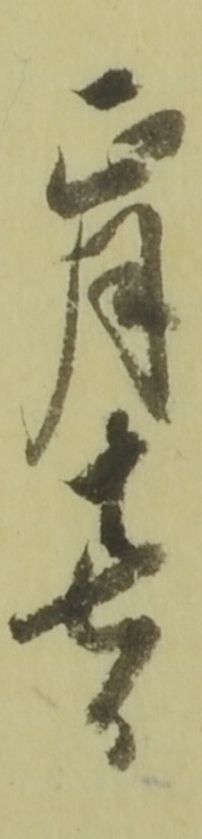正月十七日
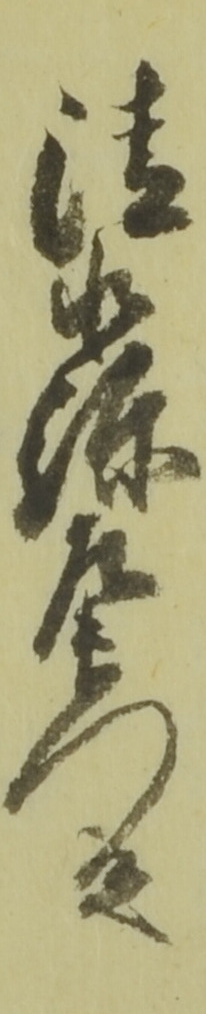清水弥左衛門殿
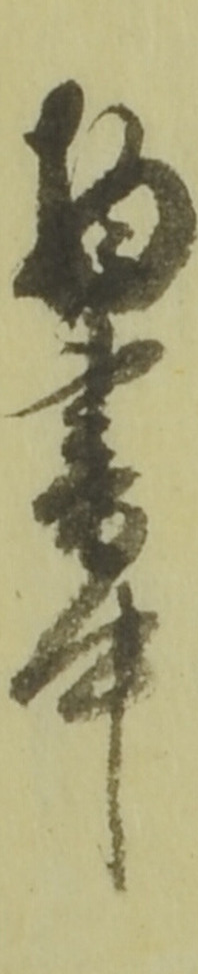物書中
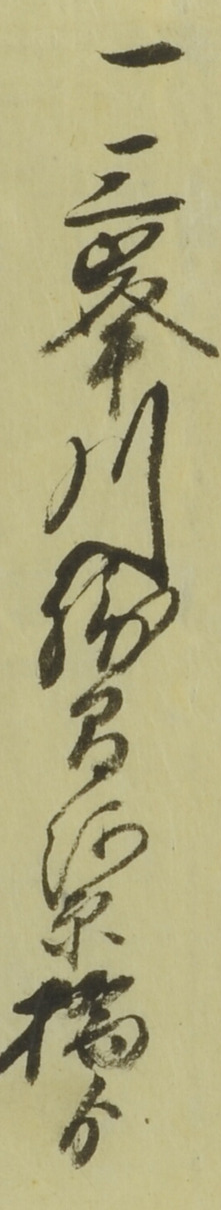一三峯川縁間河原橋ゟ
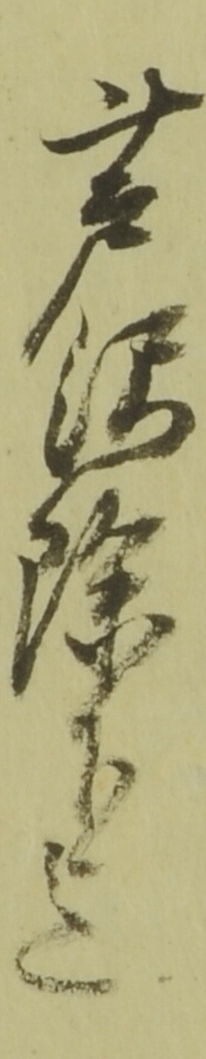芦沢除下迄
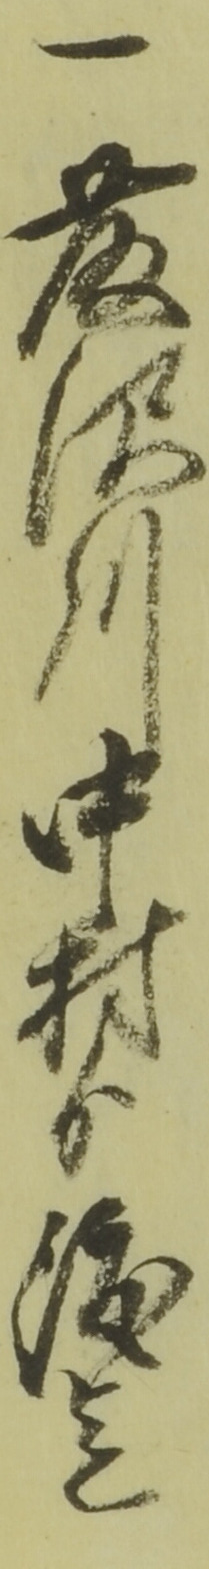一藤沢川中村ゟ渡迄
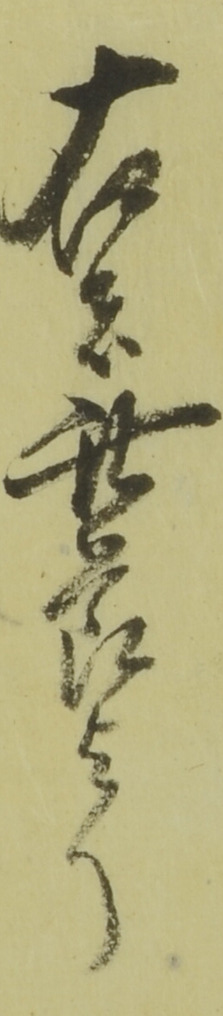右は此節より
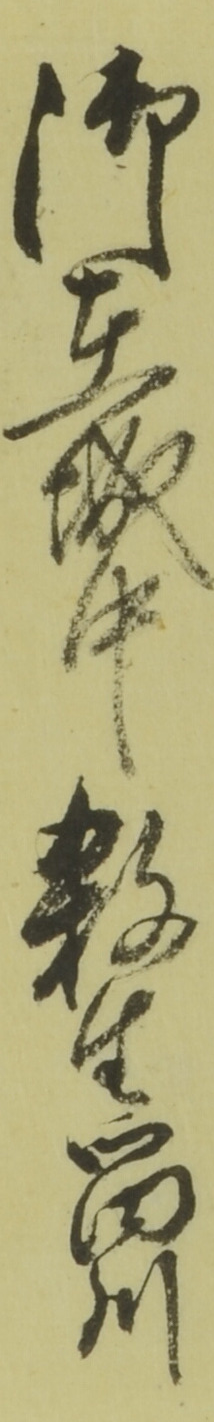御在城中殺生留川
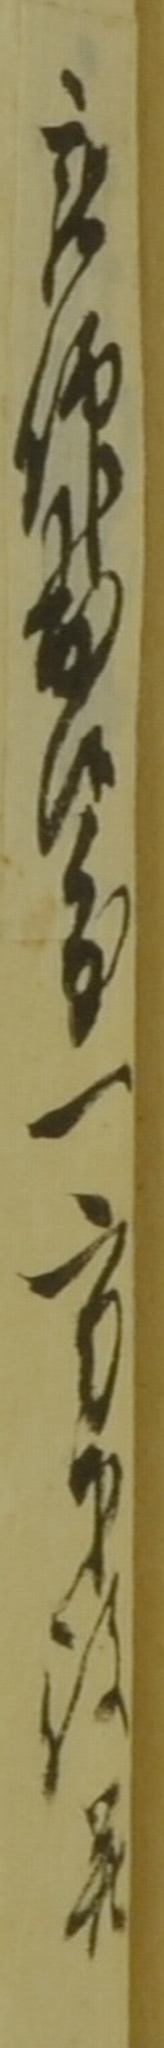被仰出候分一方下役并
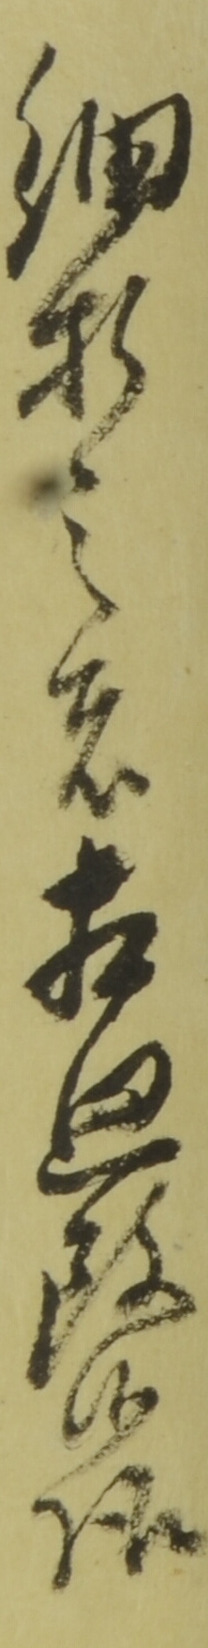細折之者相廻改候様

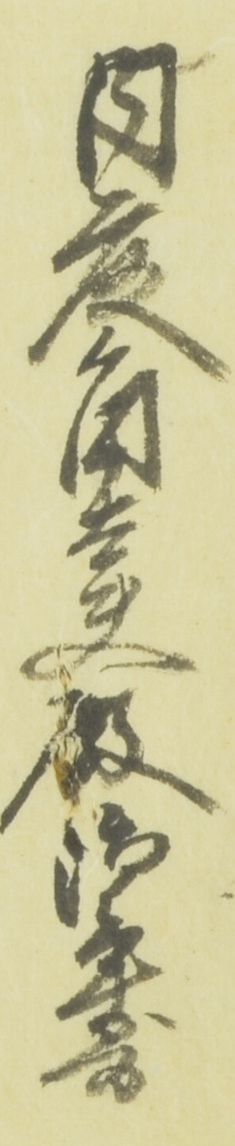内藤角太夫殿御年寄
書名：御触書御書附控
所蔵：伊那市立高遠町図書館・合同会社AMANE
